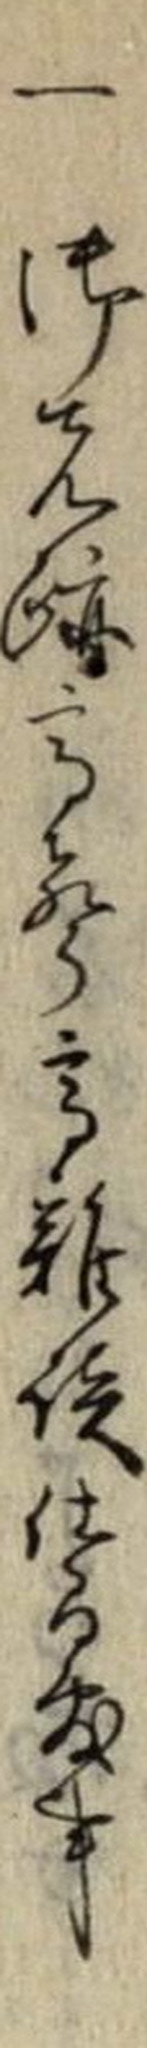一御先跡高声高雑談仕間敷事
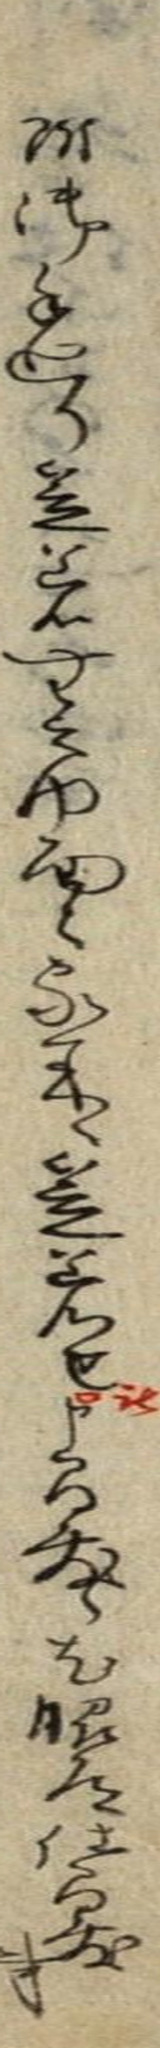附御手廻り笠着無之内面々家来へ笠着せ◦申間敷候尤脇道仕間敷事
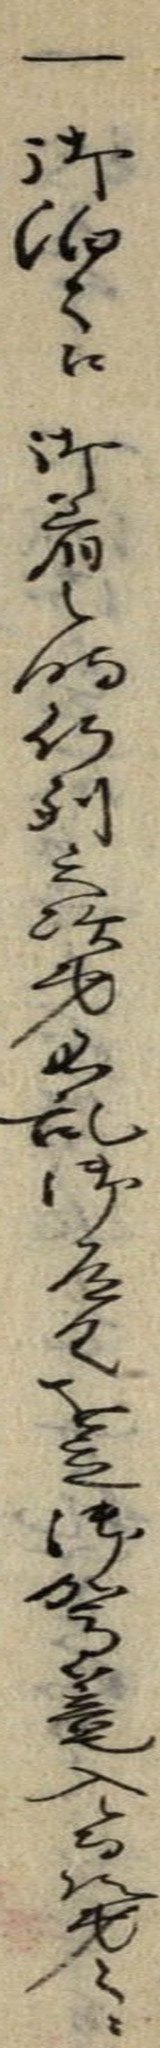一御泊々江御着之時行列之次第不乱御道具を立御駕篭入候て次第々に
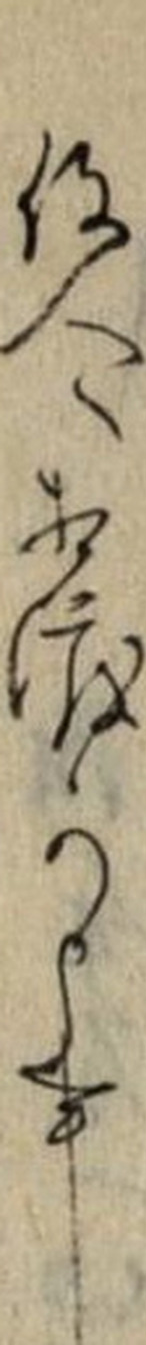役人へ相渡可申事
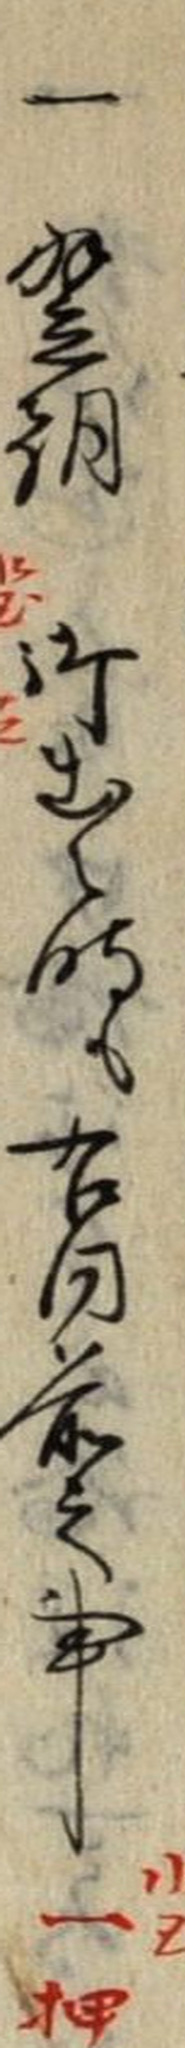一翌朝御出之時も右同前之事
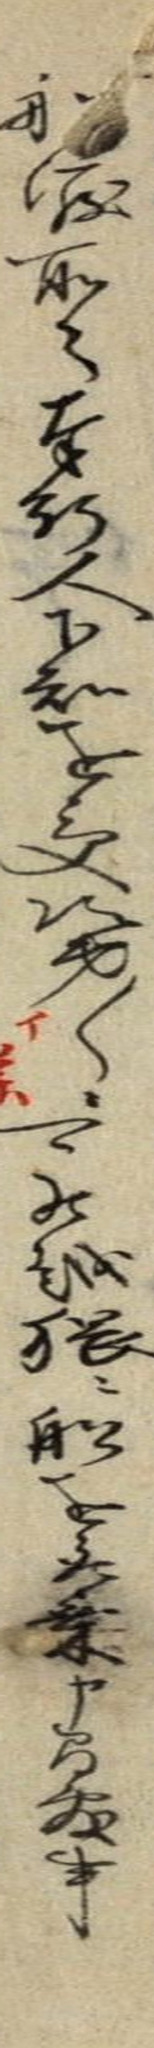一船渡所々奉行人下知を受次第〳〵に可罷越猥に船を取乗申間敷事
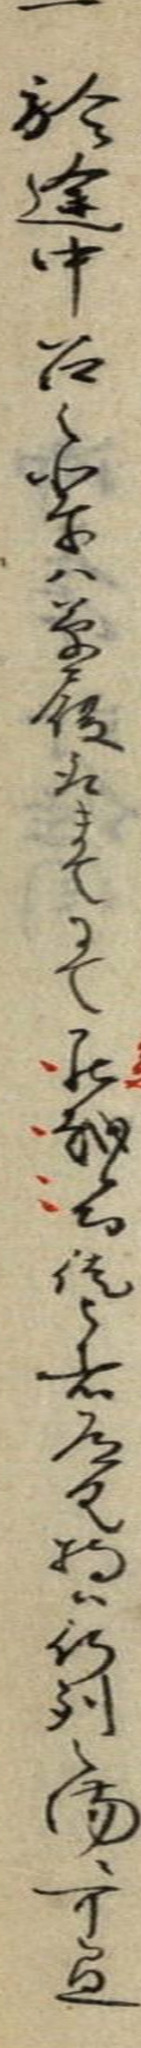一於途中召之輩は草履取まてにて罷越候て徒之者道具持は行列之場に可置
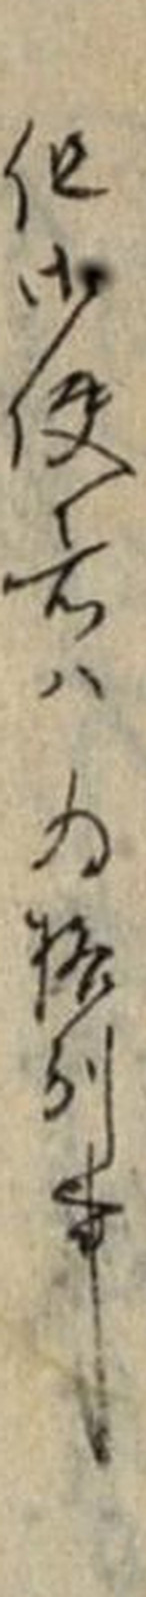但御使者は為格別事
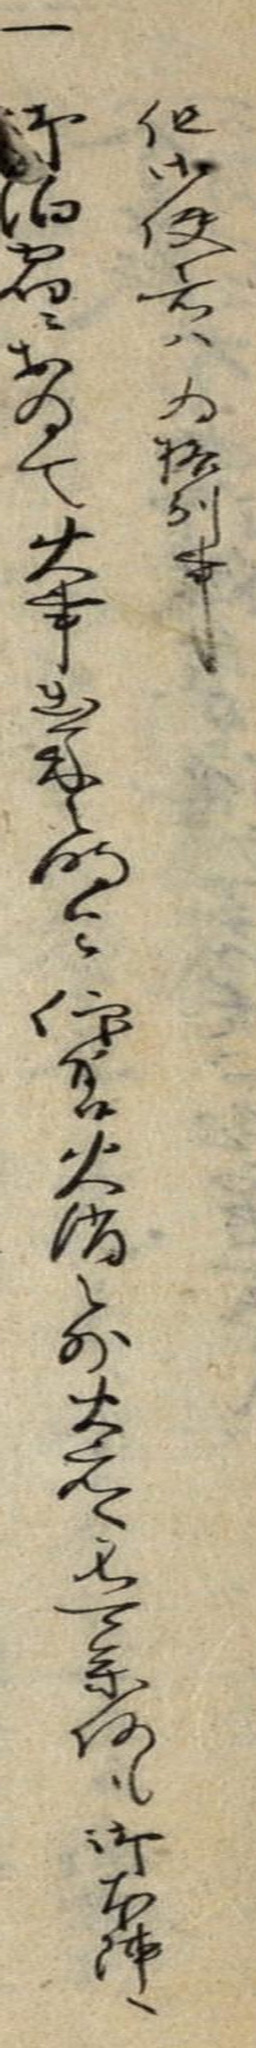一御泊宿におゐて火事出来之時は被仰付候火消之外火元へ不可参何も御本陣へ
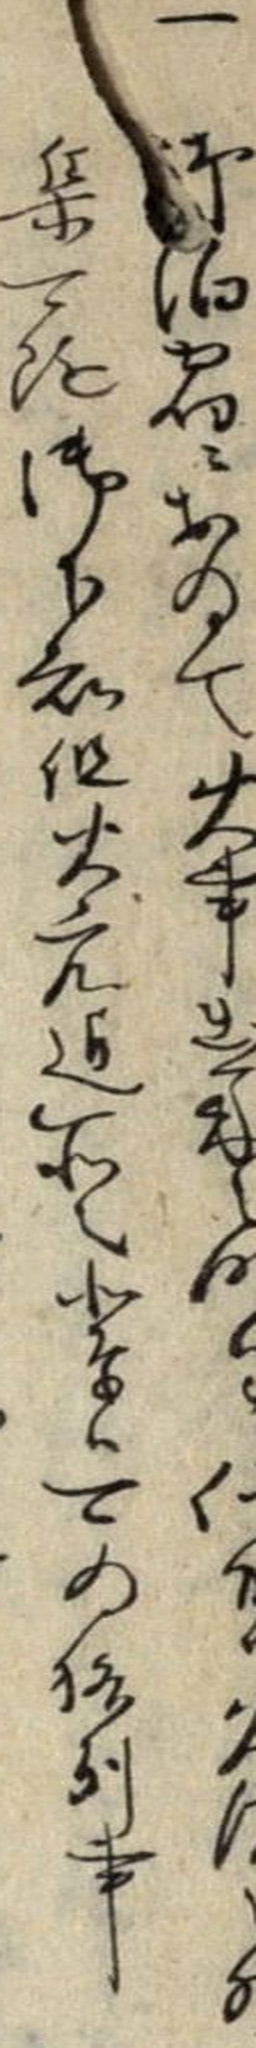集可随御下知但火元近所之輩は可為格別事
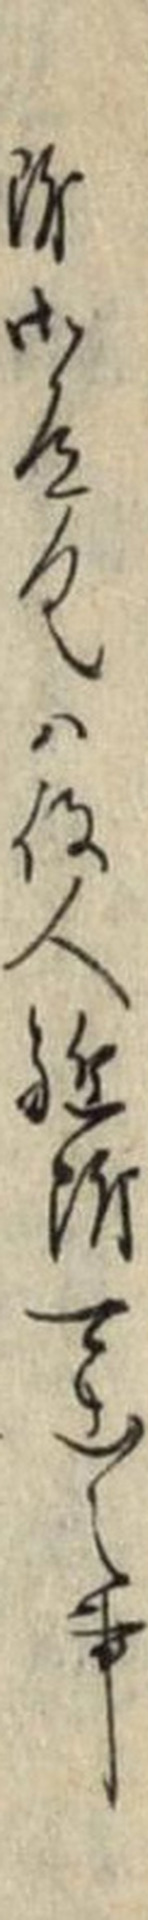附御道具は役人駆附可出之事
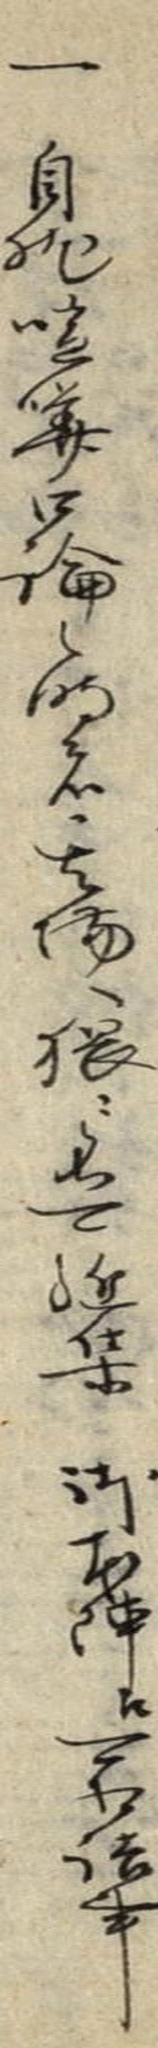一自然喧嘩口論之時は其場へ猥に不可駆集御本陣江可相詰事
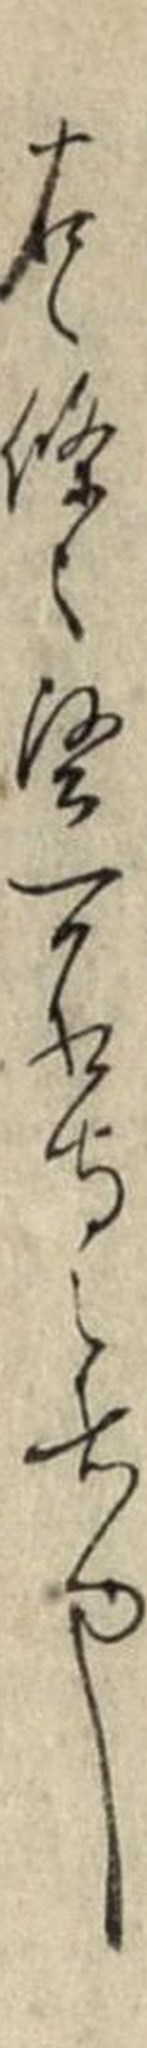右之條々堅可相守之者也
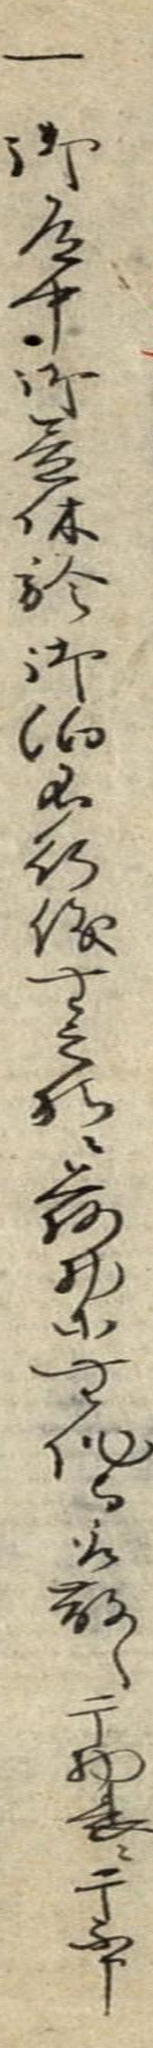一御道中御昼休於御泊不行儀無之様に荷物等無作と取散し干物表に干不申
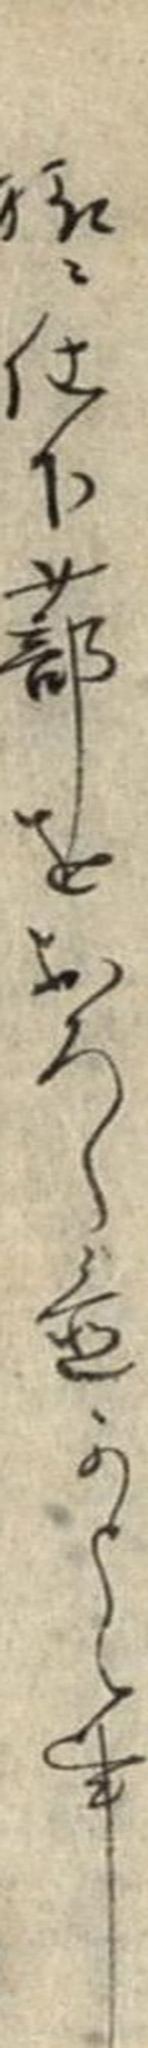様に仕下蔀をおろし置可申候事
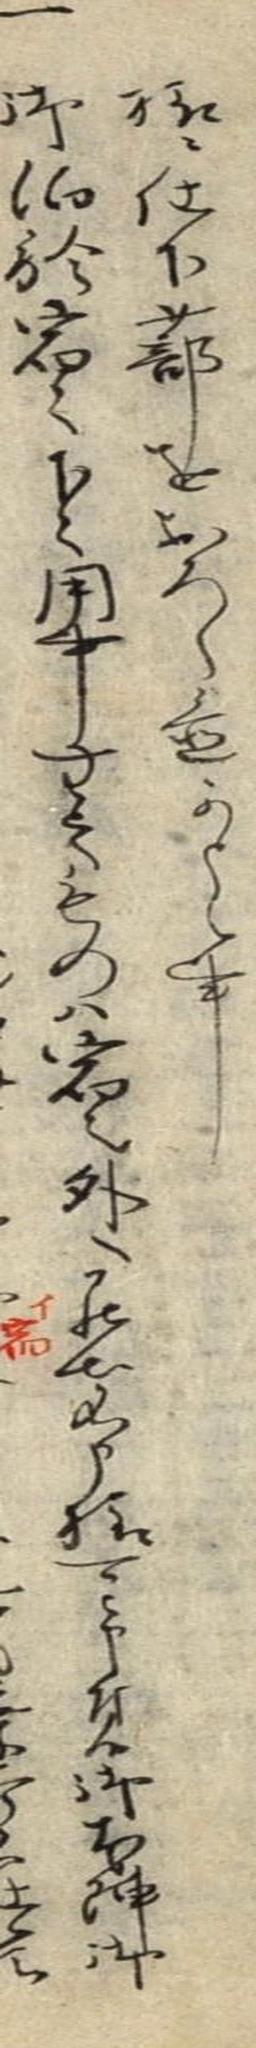一御泊於宿々下々用事無之ものは宿之外へ罷出不申様可被申付候御本陣御
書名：三都并道中之部
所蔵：福井県文書館 Fukui Prefectural Archives
